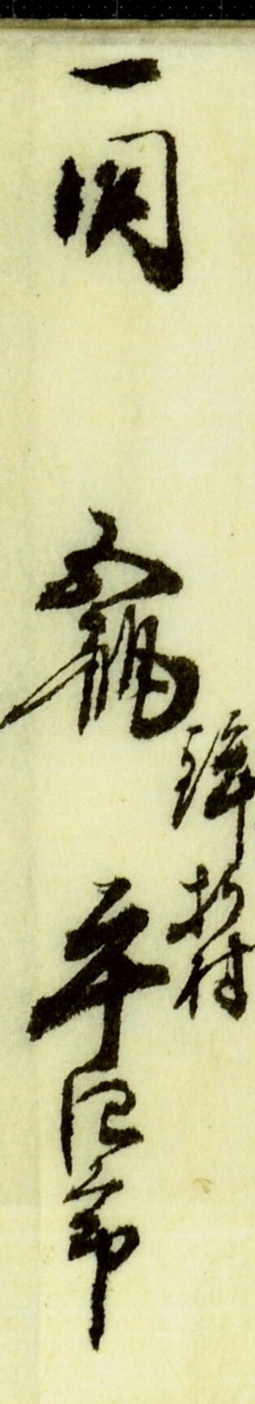一同五瓶平四郎
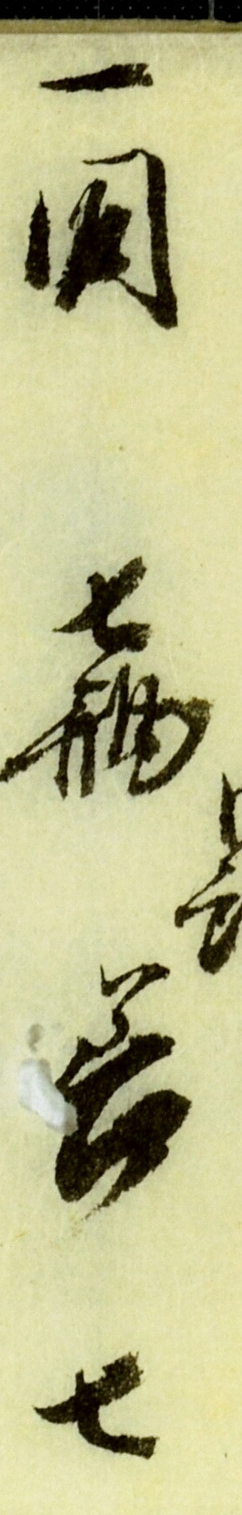一同七瓶善七
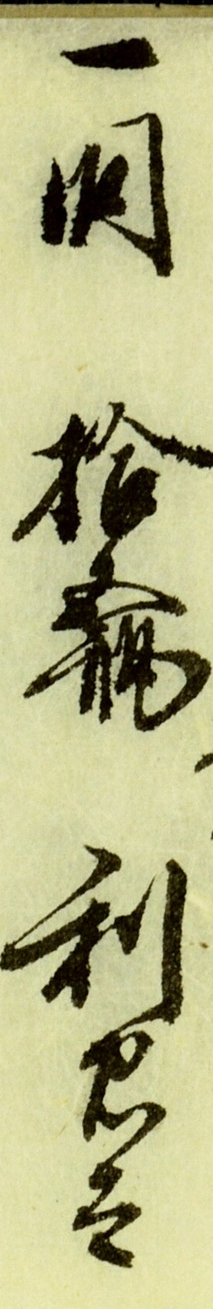一同拾五瓶利忠太
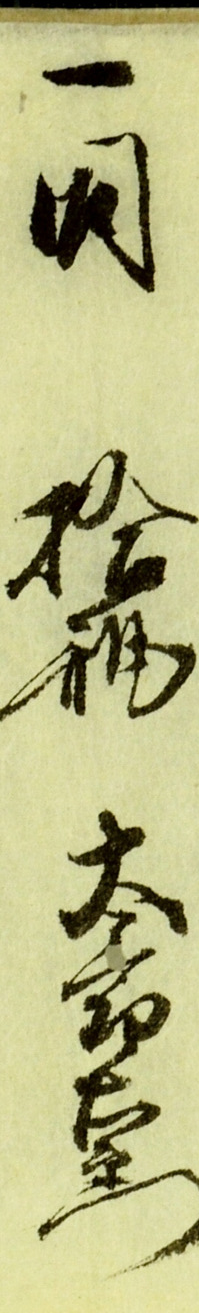一同拾瓶太郎右衛門
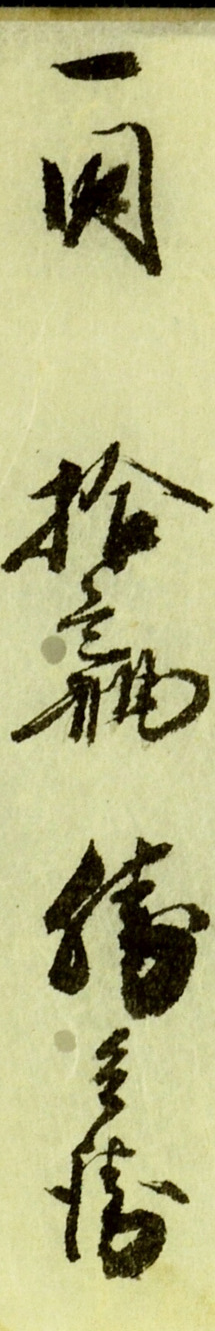一同拾壱瓶勝兵衛
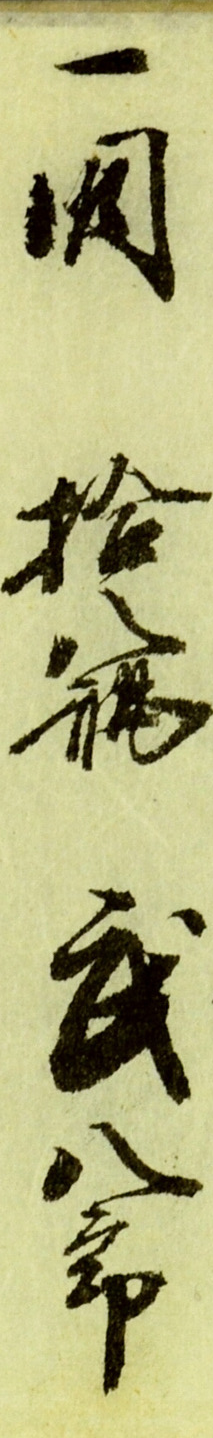一同拾八瓶武八郎
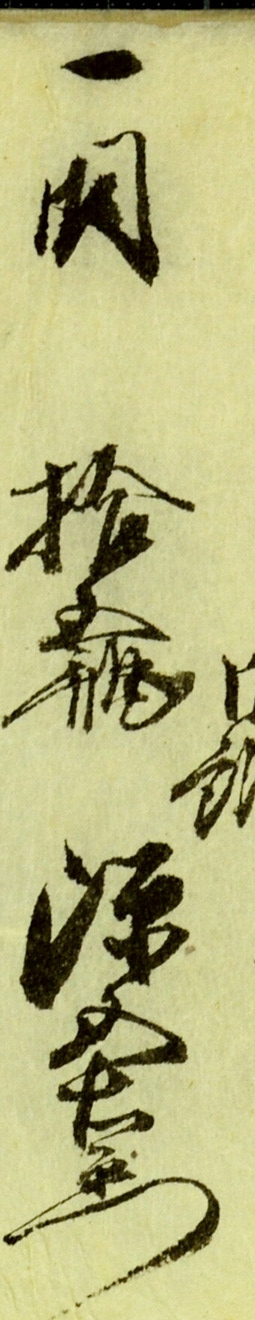一同拾五瓶源五右衛門
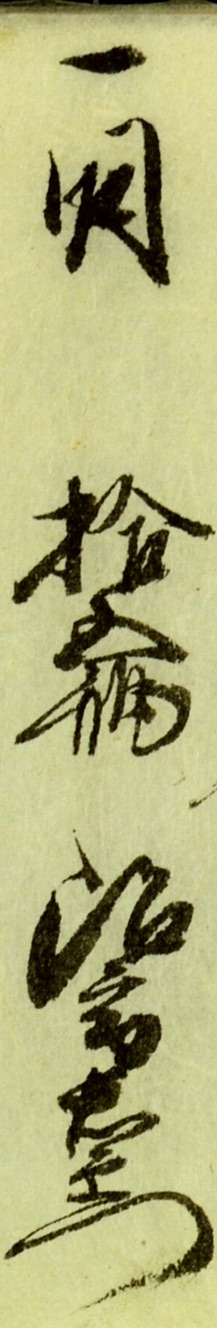一同拾五瓶源五右衛門
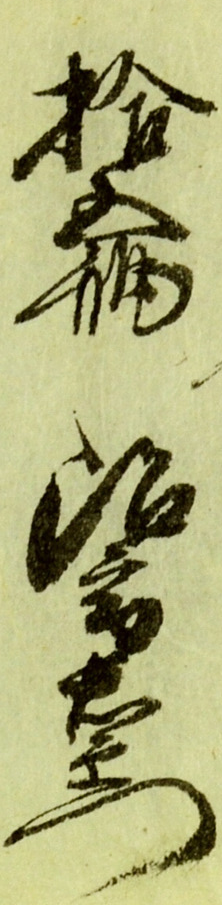一同拾五瓶源五右衛門

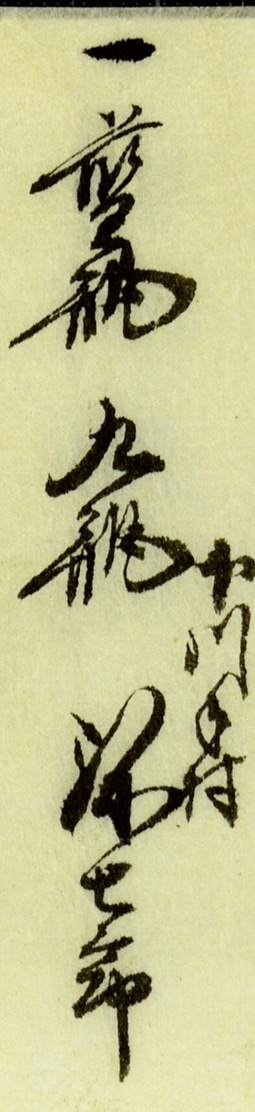一藍瓶九瓶弥七郎
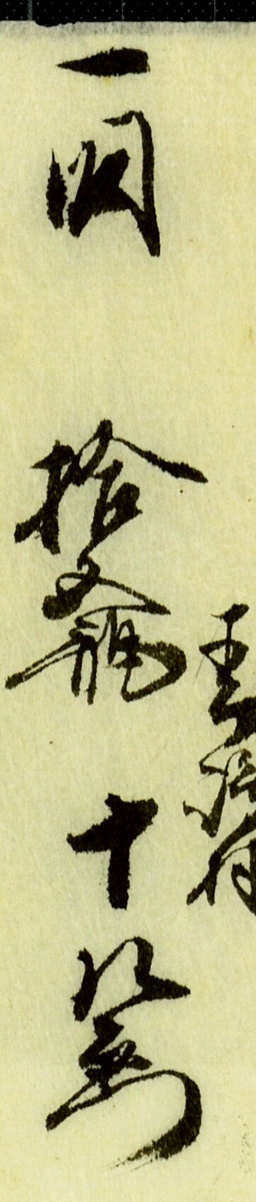一同拾五瓶十左衛門
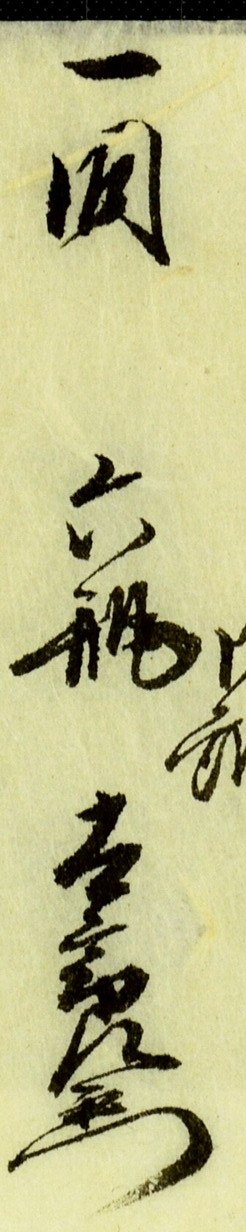一同六瓶太郎左衛門
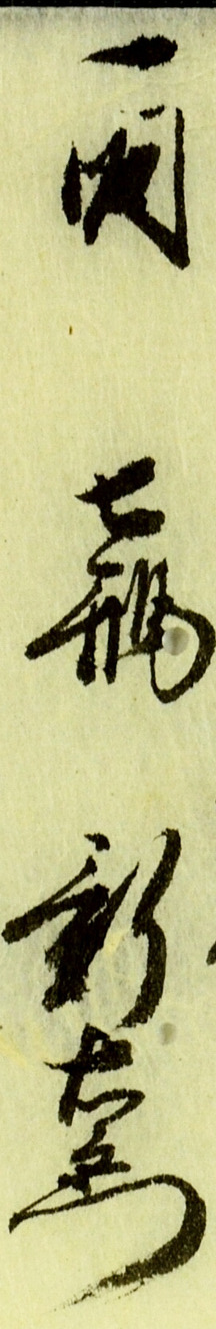一同七瓶新右衛門
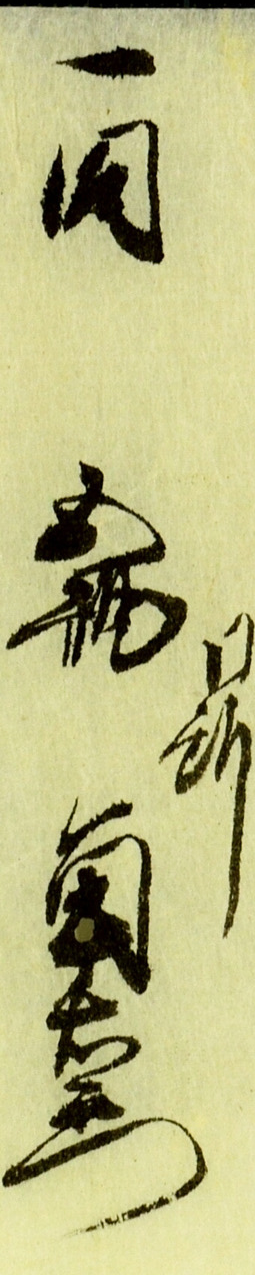一同五瓶角右衛門
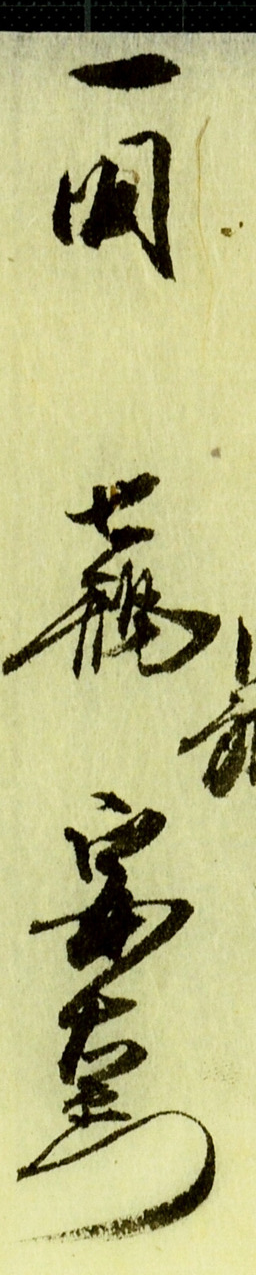一同七瓶新右衛門
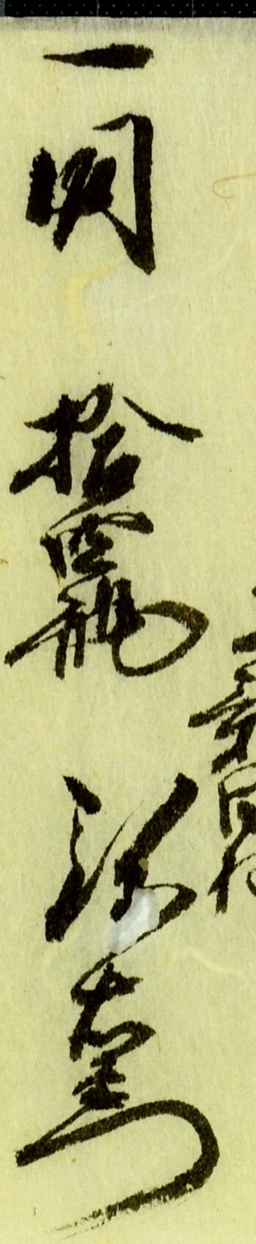一同拾四瓶弥右衛門
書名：御領分中御領分中紺屋藍瓶員数御改帳
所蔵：伊那市立高遠町図書館・合同会社AMANE
